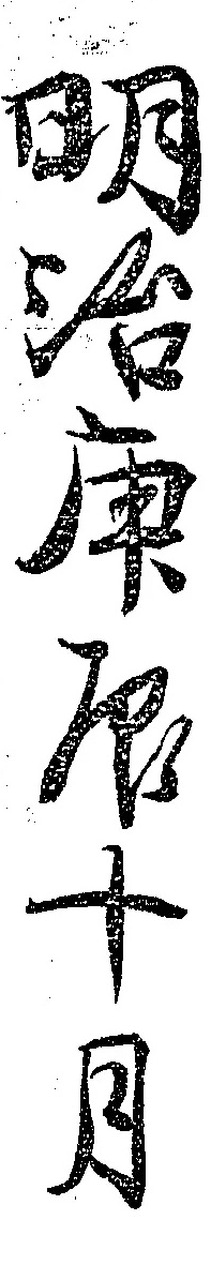明治庚辰十月
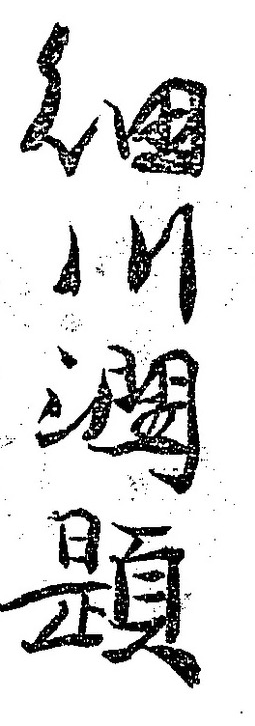細川潤題
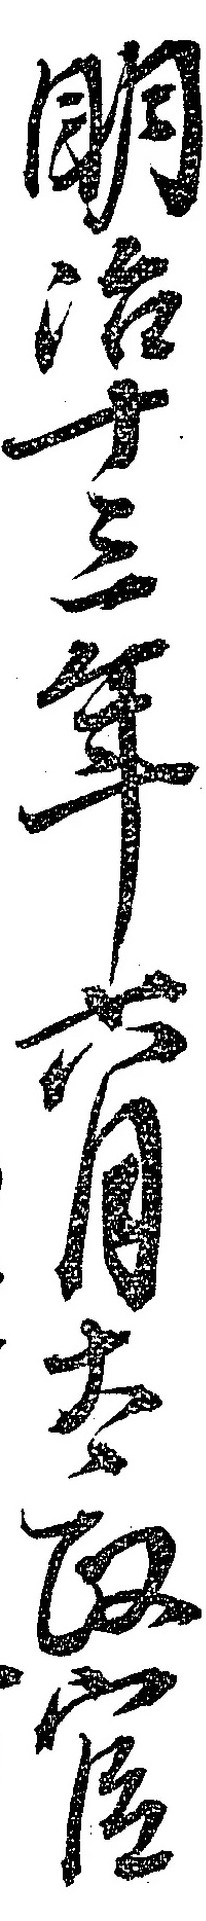明治十三年六月太政官
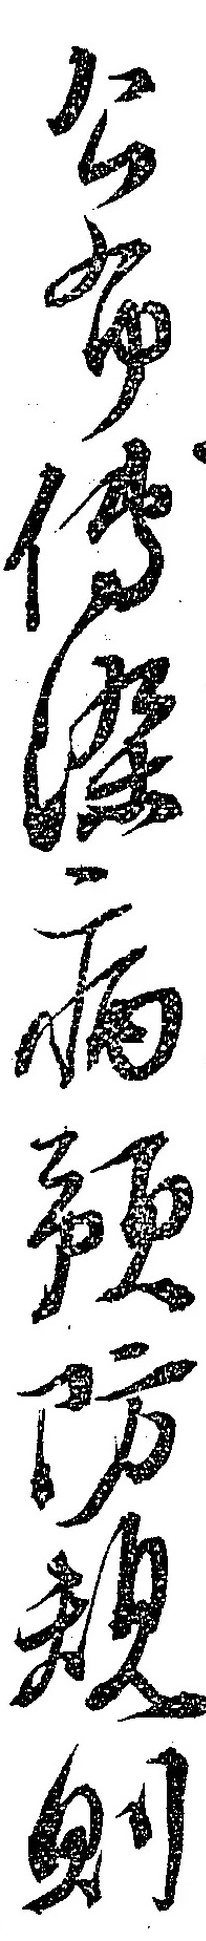公布伝染病預防規則
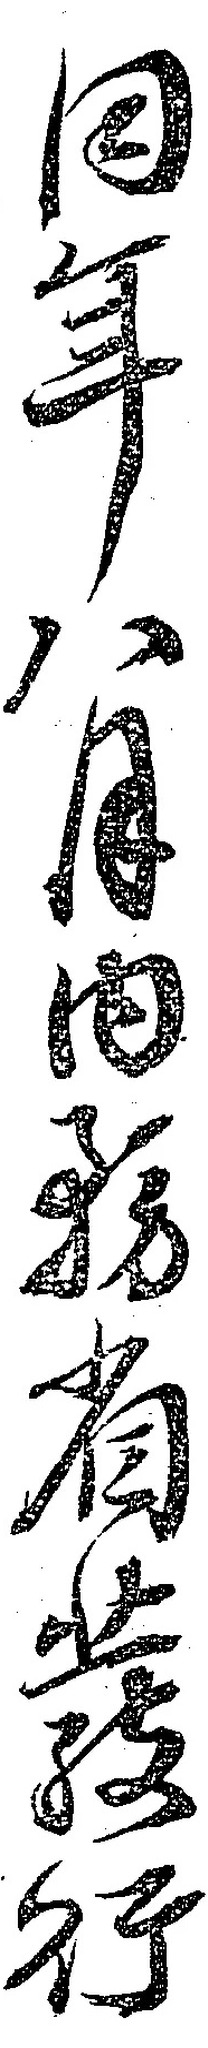同年八月内務省叢行
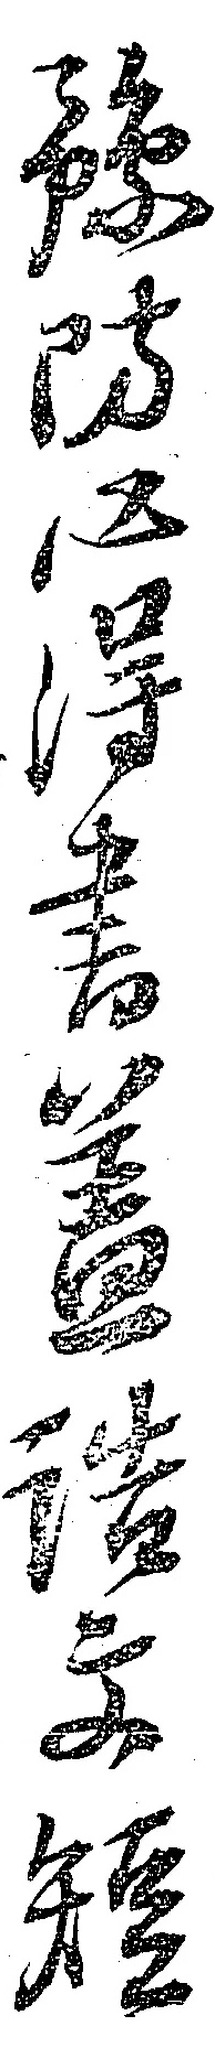豫防ｈ必得書蓋詰文短
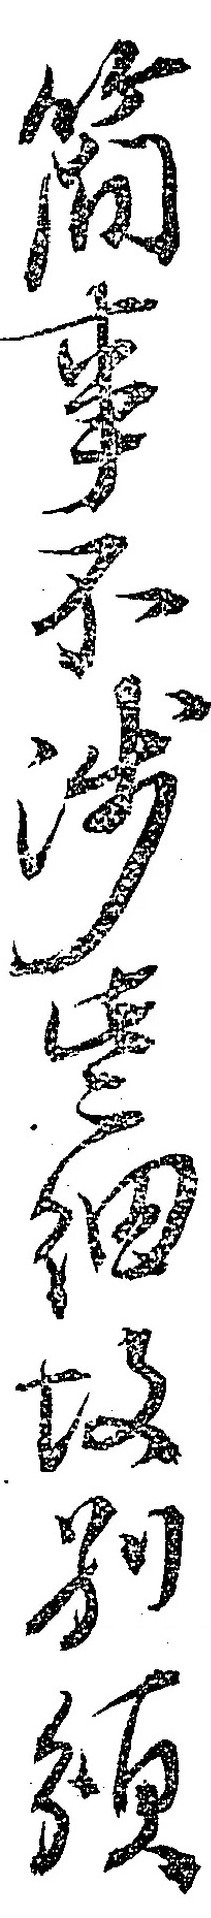簡事不渉些細攻別頒
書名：伝染病予防法心得書演解
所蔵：国立国会図書館 National Diet Library, JAPAN
